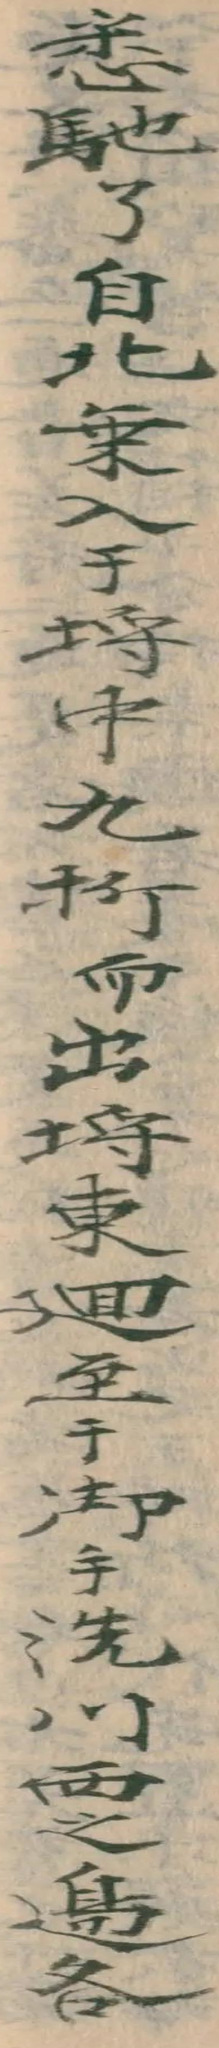悉馳了自北乗入于埒中九折而出埒東廻至于御手洗川西之辺各

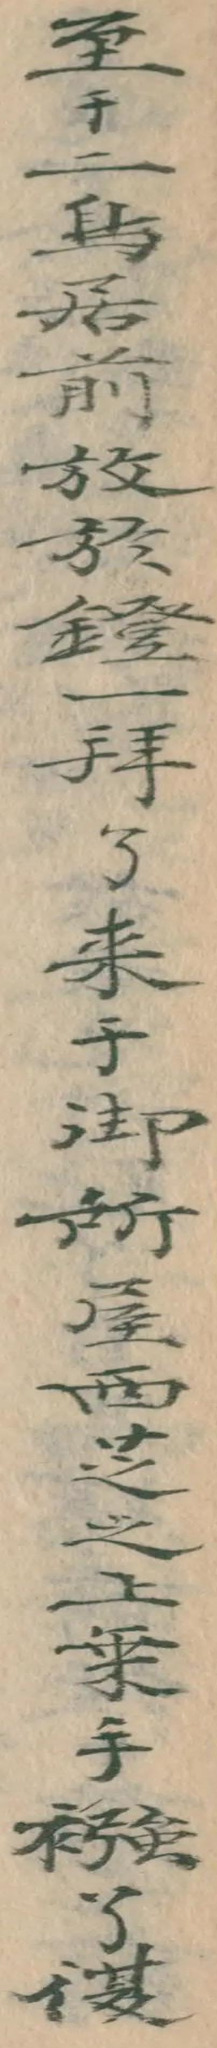至于二鳥居前放於鐙一拝了来于御所屋西芝之上乗手襁了復
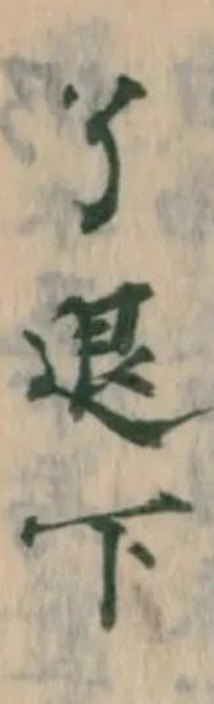了退下
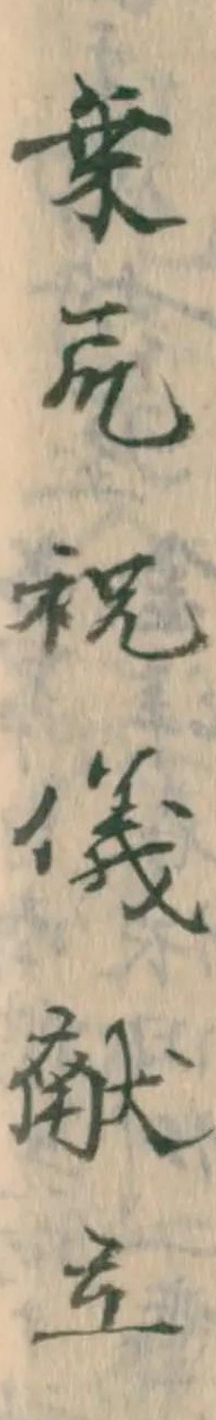乗尻祝儀献立
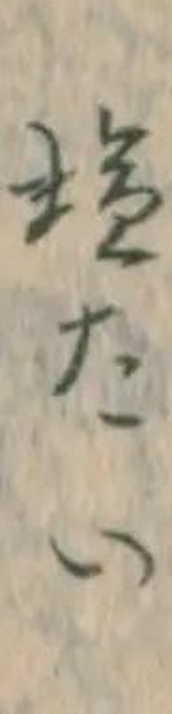塩たい
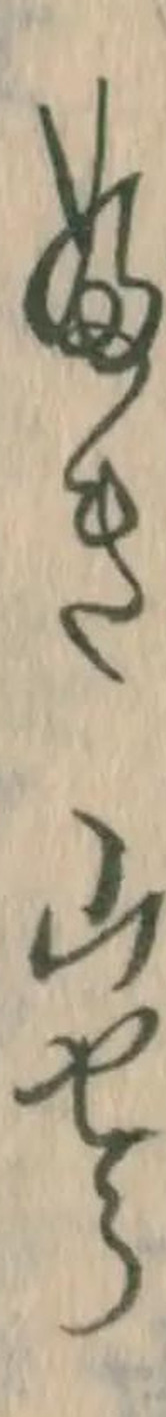ふき山せう
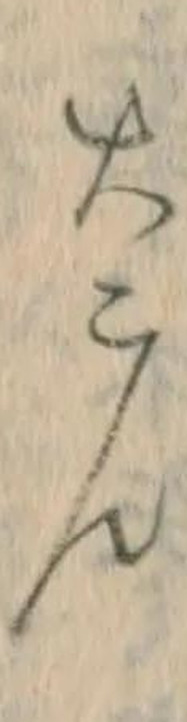大こん
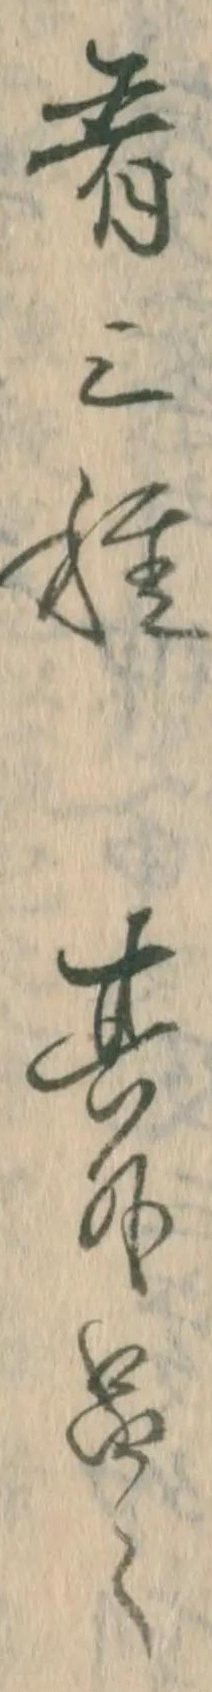肴三種其外品々
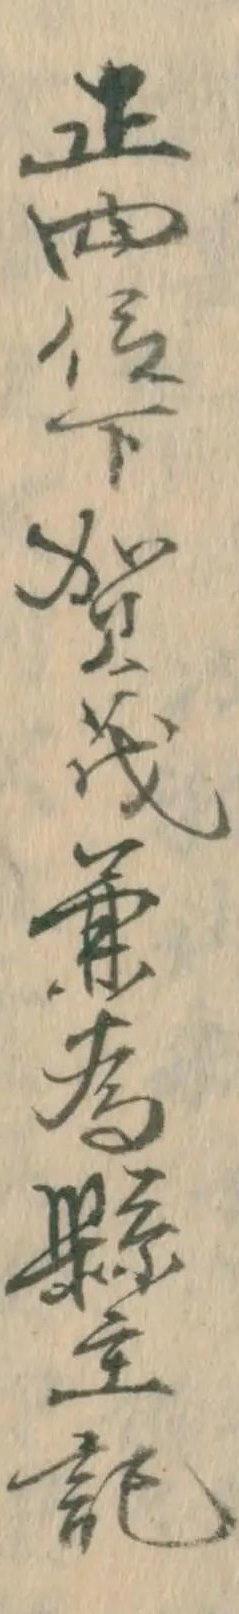正四位下賀茂兼為県主記

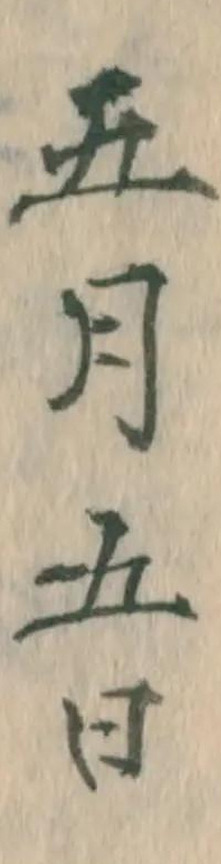五月五日
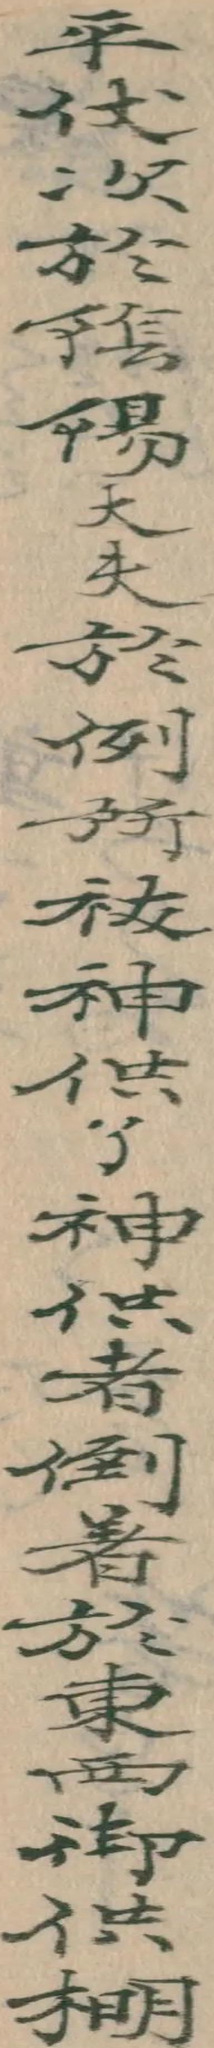平伏次於陰陽大夫於例所祓神供了神供者倒着於東西御供棚
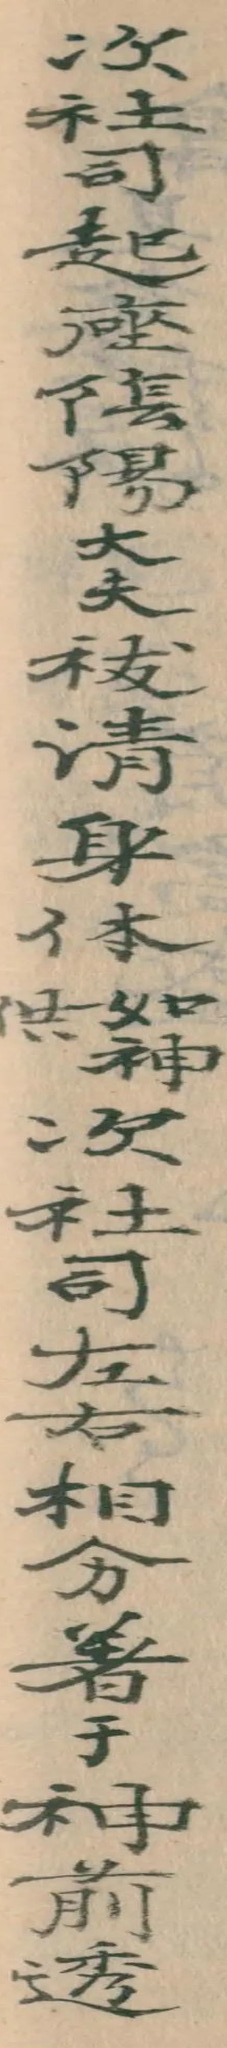次社司起座陰陽大夫祓清身体如神供次社司左右相分着于神前透

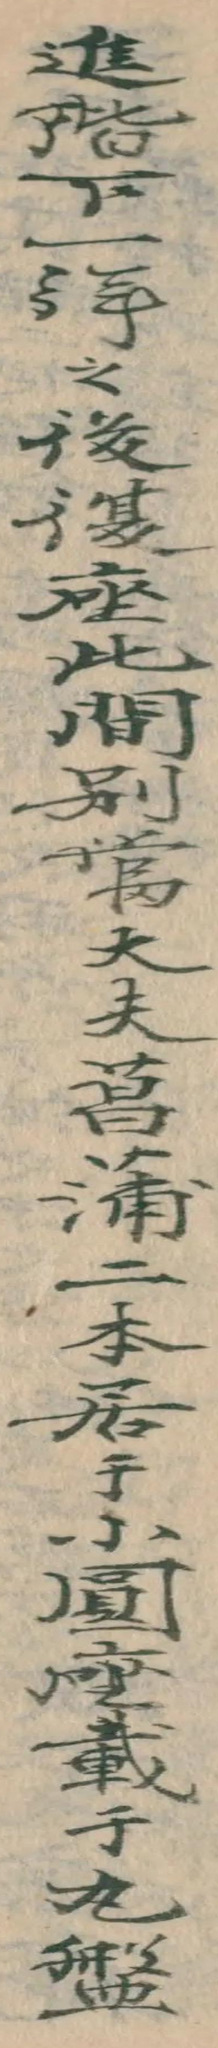進階下一拝之後復座此間別当大夫菖蒲二本居于小円座載于丸盤
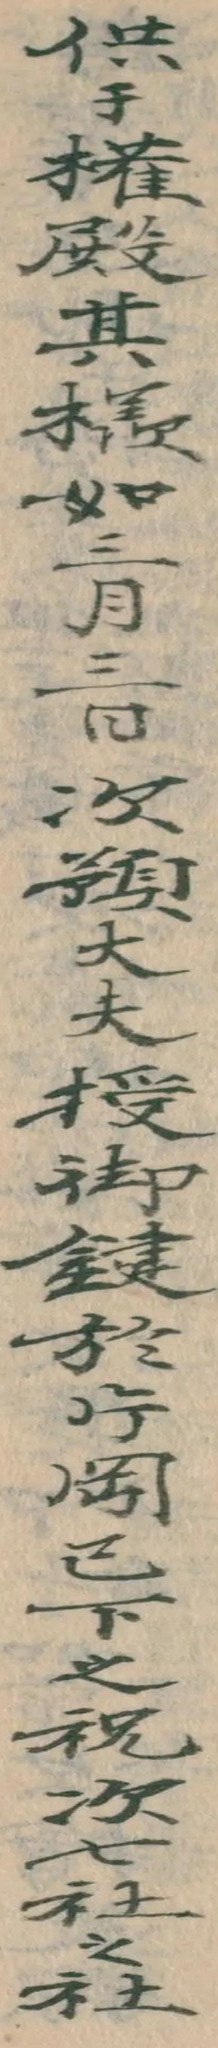供于権殿其様如三月三日次預大夫授御鍵於片岡已下之祝次七社之社
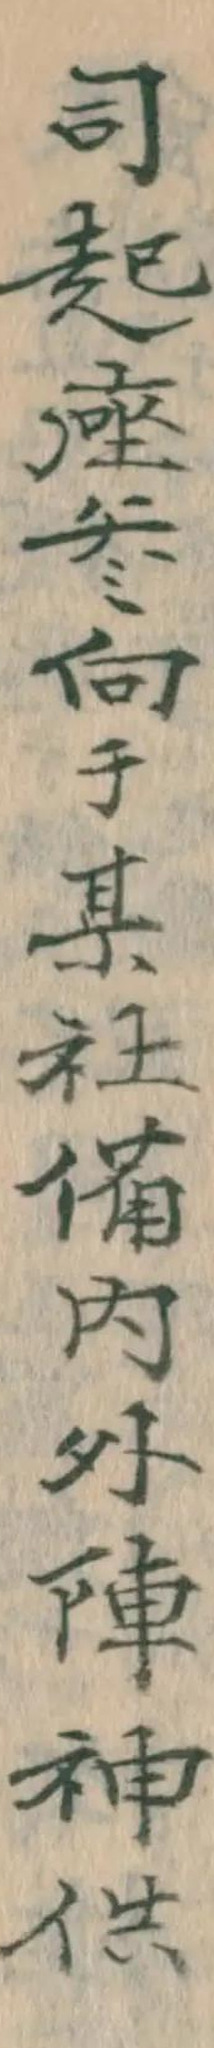司起座参向于某社備内外陳神供
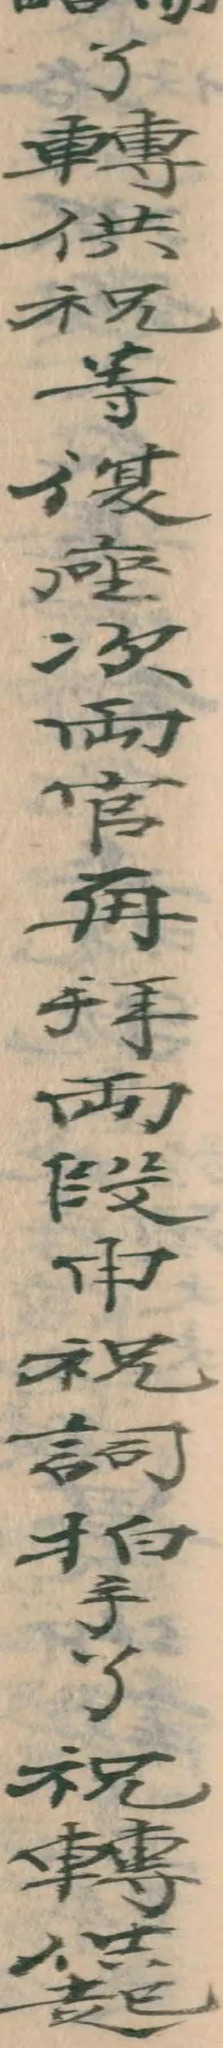而略了転供祝等復座次両官再拝両段申祝詞拍手了祝転供起
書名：賀茂社記録. 第9冊
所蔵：国立国会図書館 National Diet Library, JAPAN
